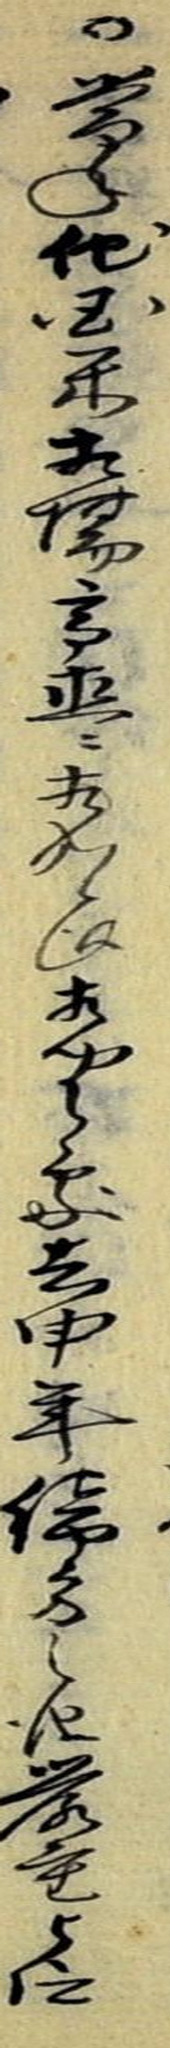○当年他国米相場高直ニ相成候趣相聞候処去申年締方之儀厳重被仰
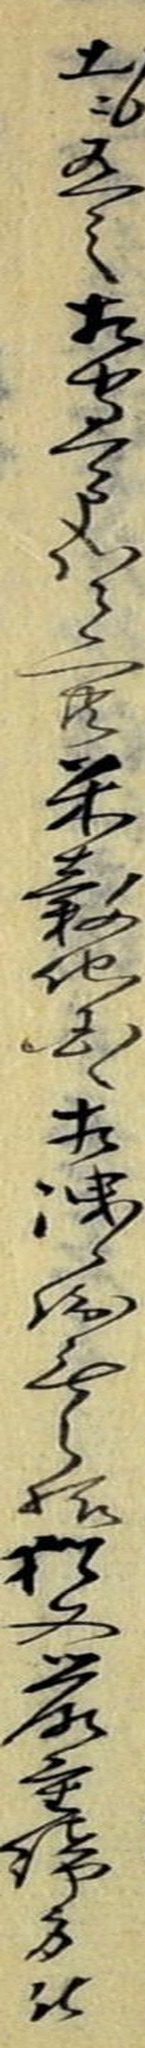出も有之相守可申哉ニ候へ共米穀他国へ相洩候儀無之様猶又厳重締方被
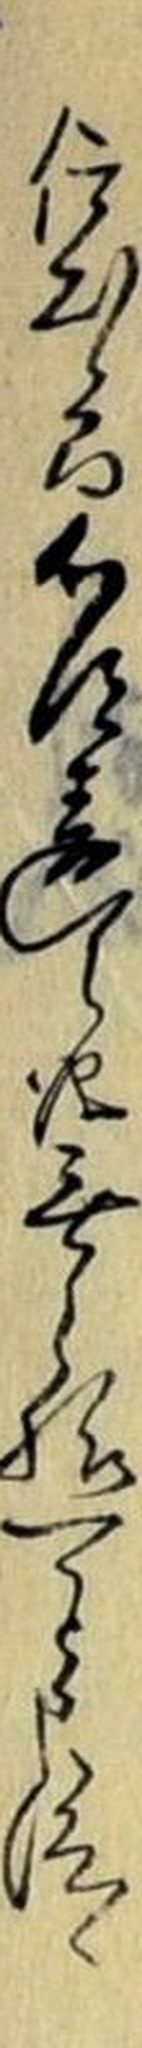仰出候間心得違之儀無之様可被申渡候
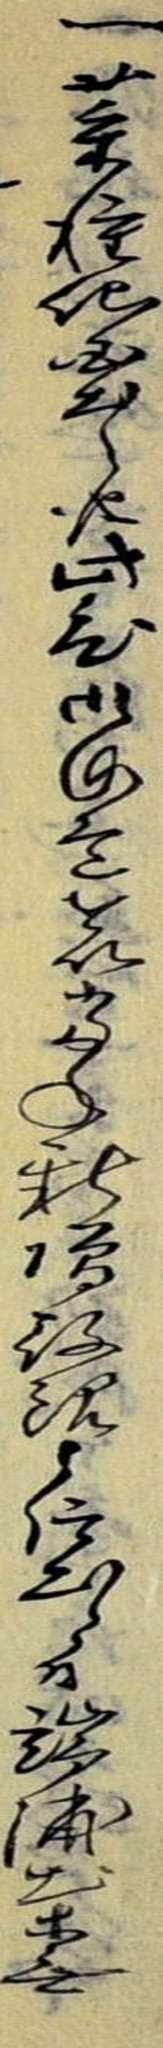一菜種他国出之儀此度御趣意を以当年新増役銀被仰出候ニ付端浦出等無
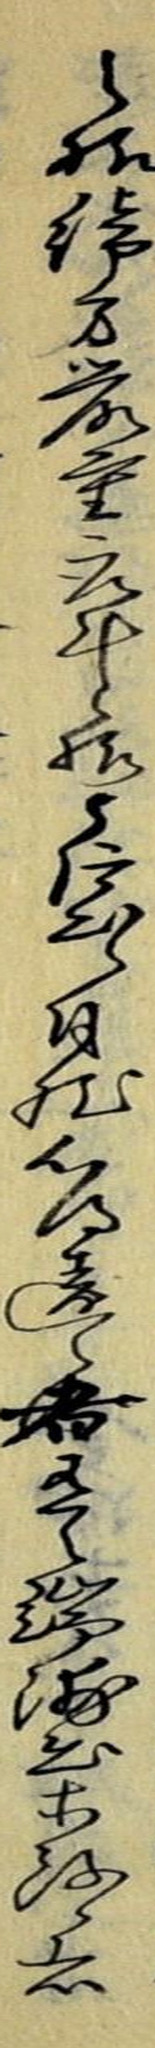之様締方厳重取計候様被仰出候自然心得違之者有之端浦出等致候者
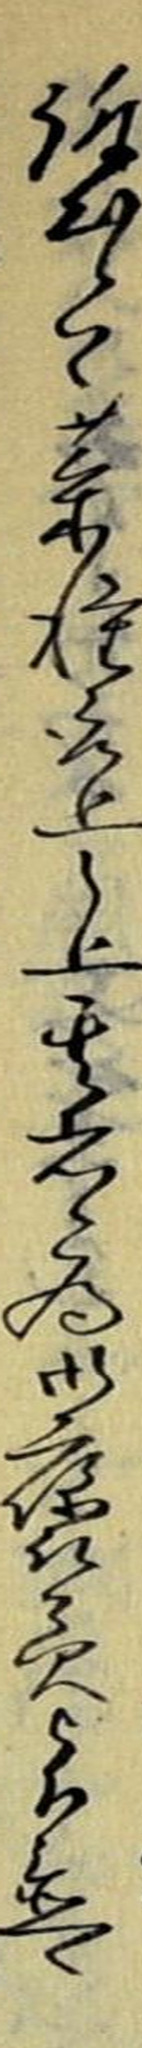訴出候ハヽ菜種取上之上其者へ為御褒美被下置候
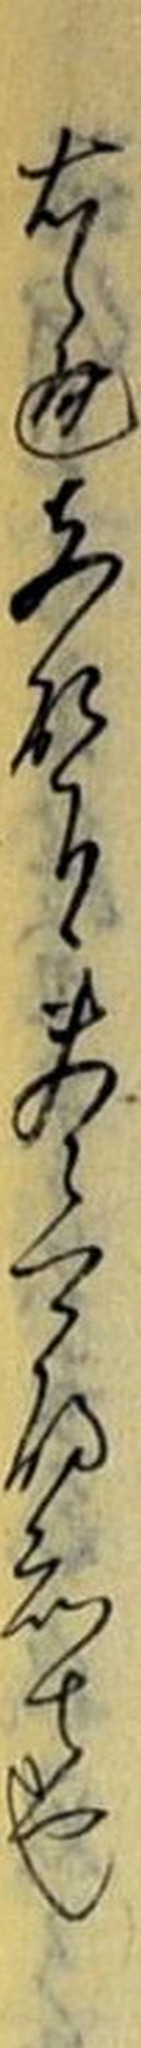右之通支配下へ夫々可触知者也
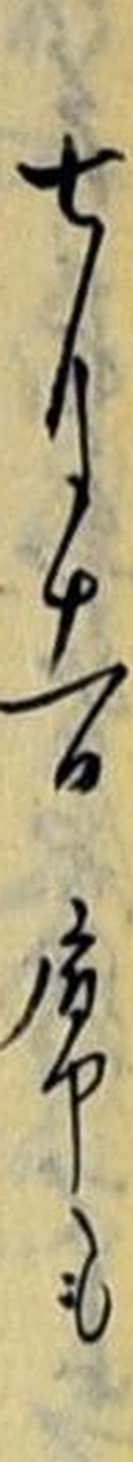七月十一日府中へも
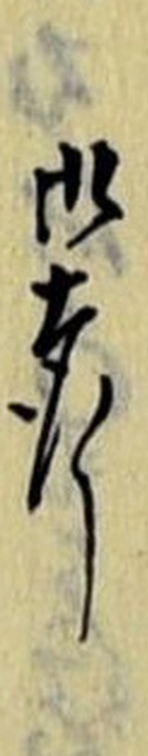御奉行
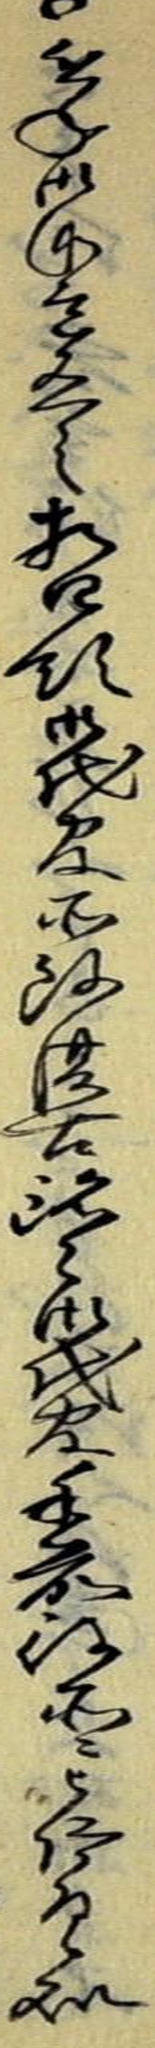○近年御趣意有之拾四領御代官所致復古銘々御代官手前役所ニ被仰付候処
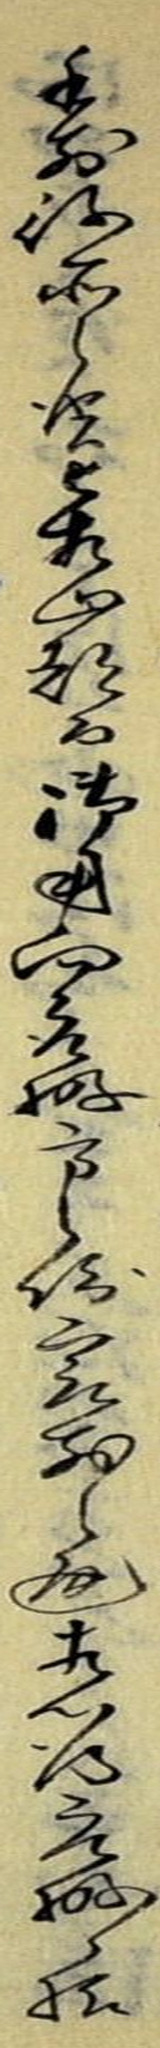手前役所之儀ハ被相止都而御用向取扱方之儀最前之通相心得取扱候様
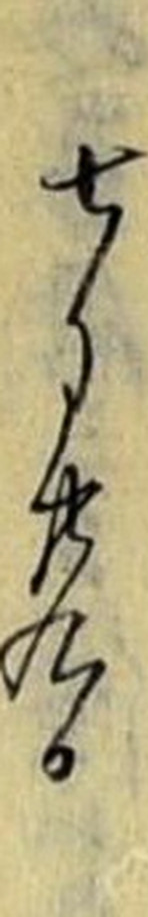七月廿九日
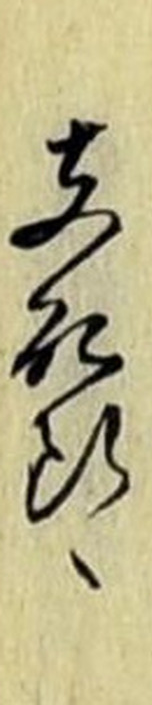支配頭へ
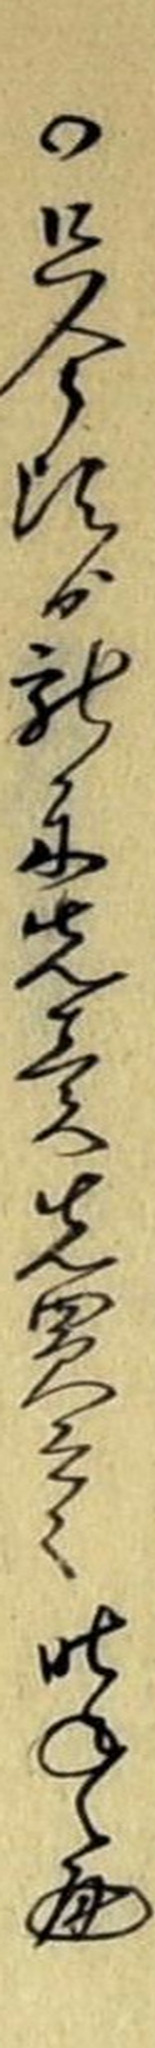○只今頭ゟ新米先売先買云々昨年之通
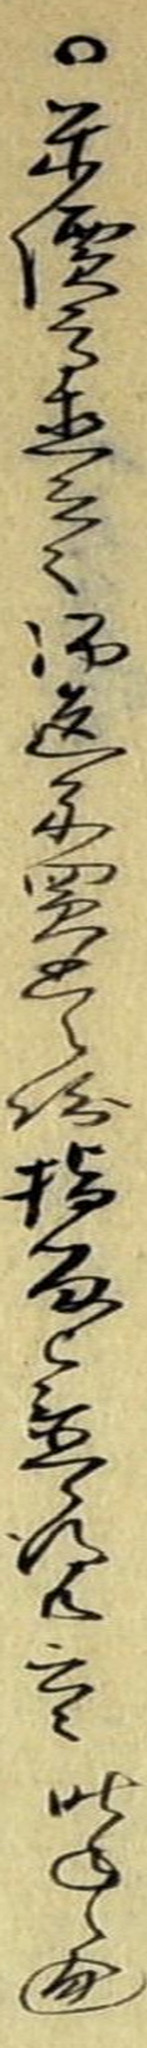○米価高直云々酒造米買上之儀指留被置候得共云々昨年之通
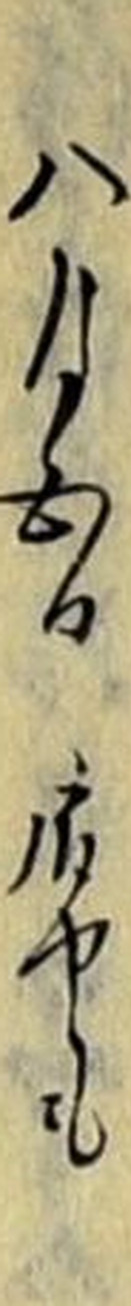八月五日府中へも
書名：命令之部 五
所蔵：福井県文書館 Fukui Prefectural Archives
